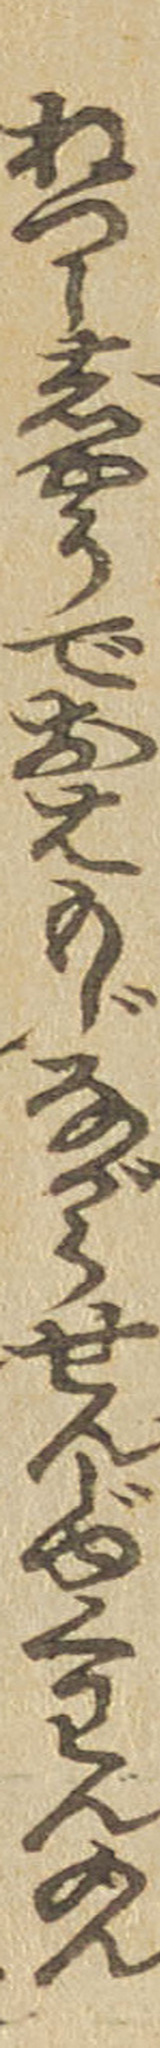ねつししやうでおはもじながらせんじゆくわんのん
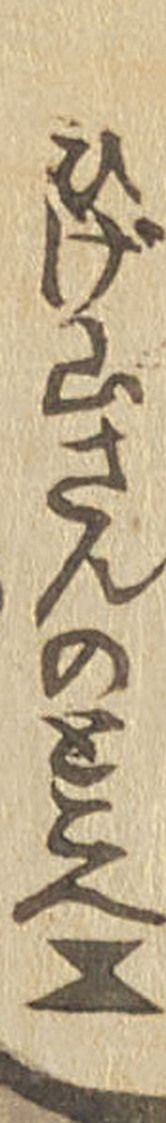ひげ山さんのとこへ▼▲
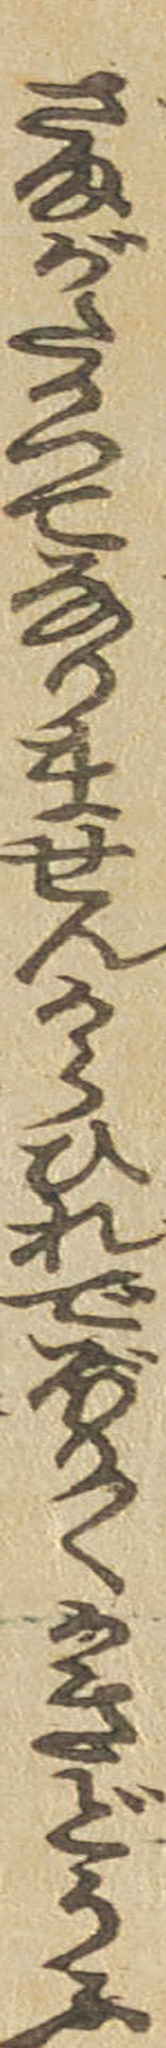さまがたかつてなりませんからひれでぼり〳〵かきどうに
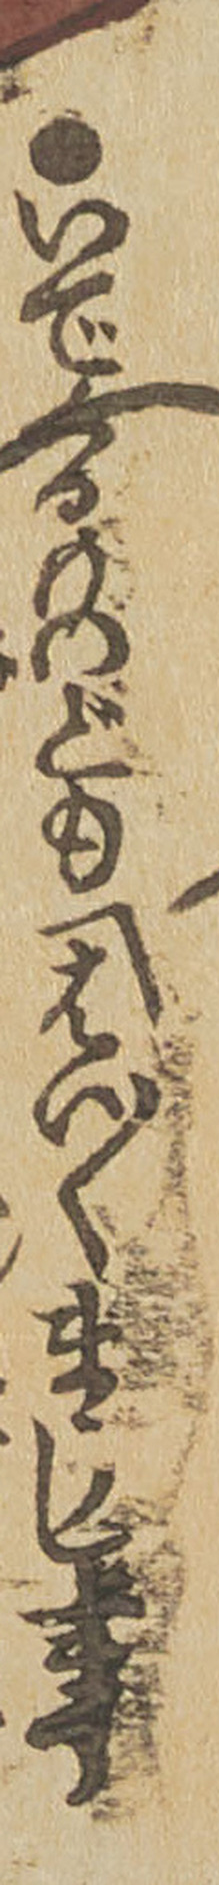●いでくるものども｢はい〳〵まうし上ます
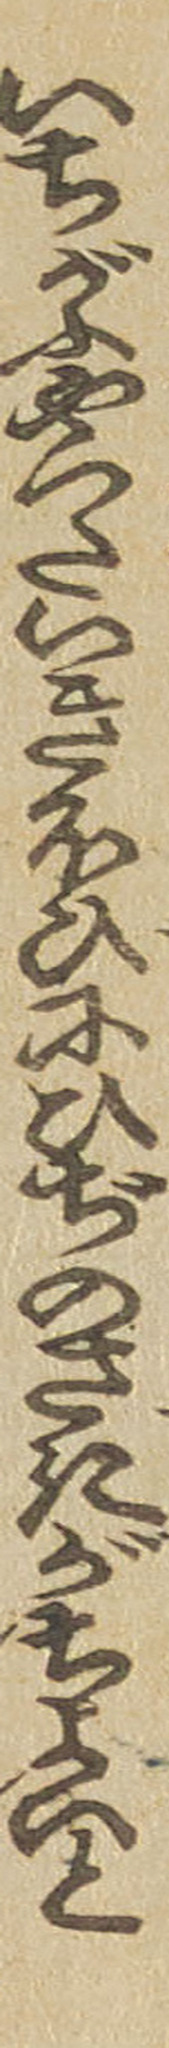いちがふやつたいきほひにひぢのさきがちよいと
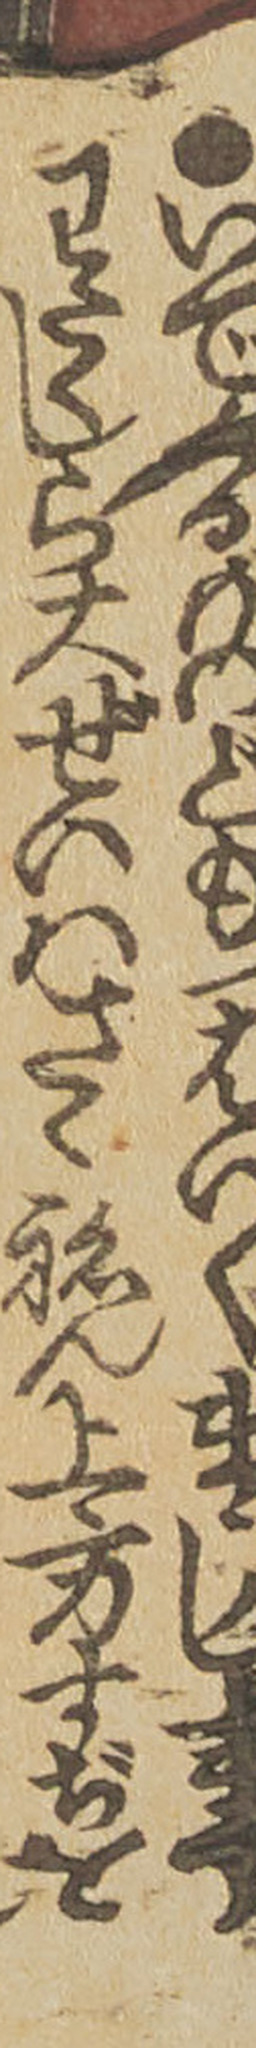わたくしら大ぜいはさくねん上方すぢを
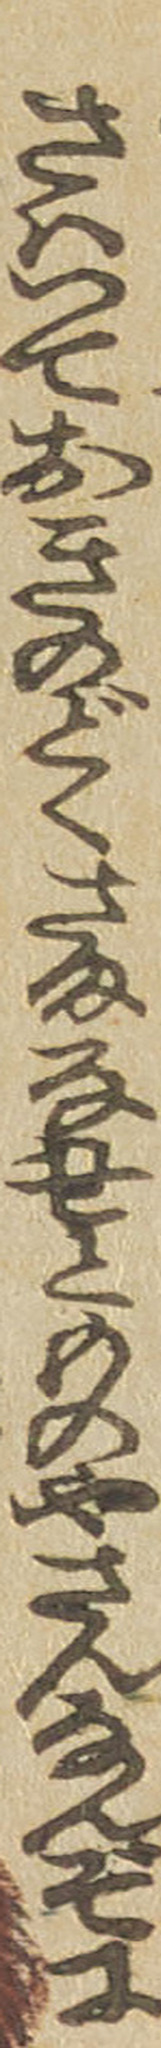さはつておきのどくさまなせとものやさんなんぞに
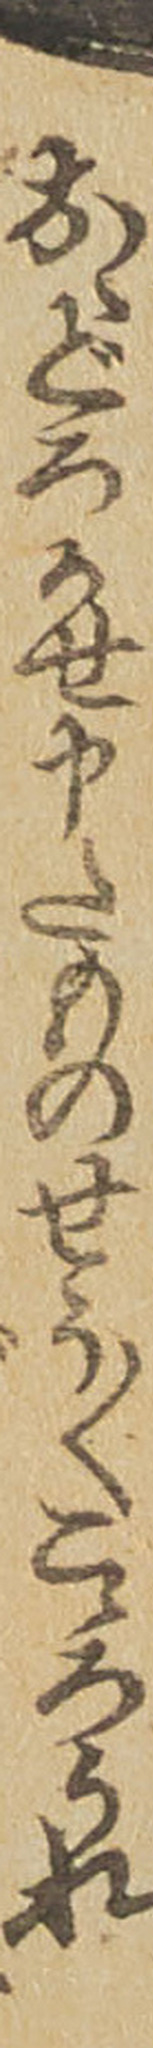おゝどろかせ申たものせう〳〵こゝろうれ
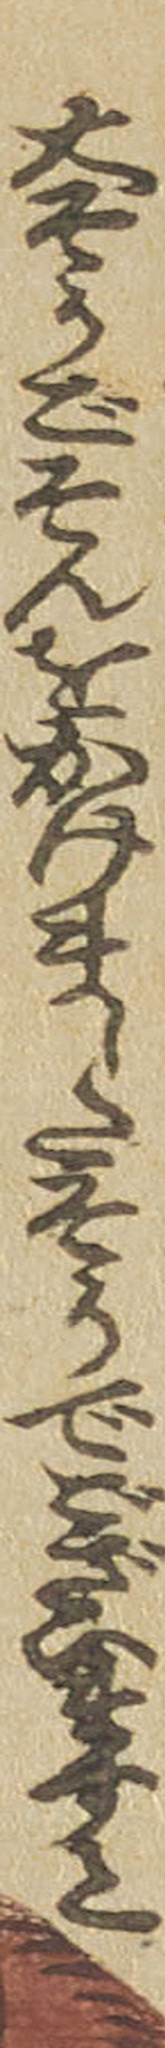大そうごそんをかけましたそうでございますと
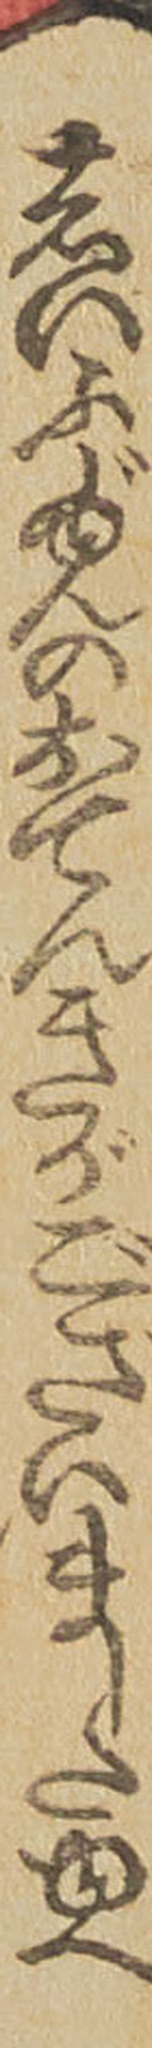しいふじゆんのおてんきがございましたゆへ
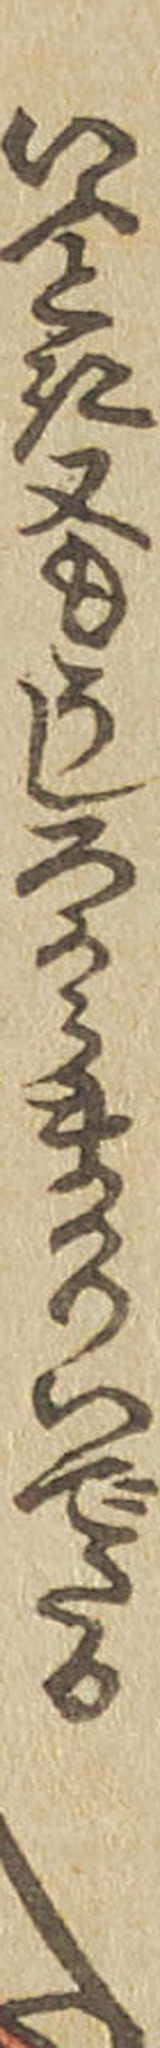いふとき又もうしろからまかりいでたる
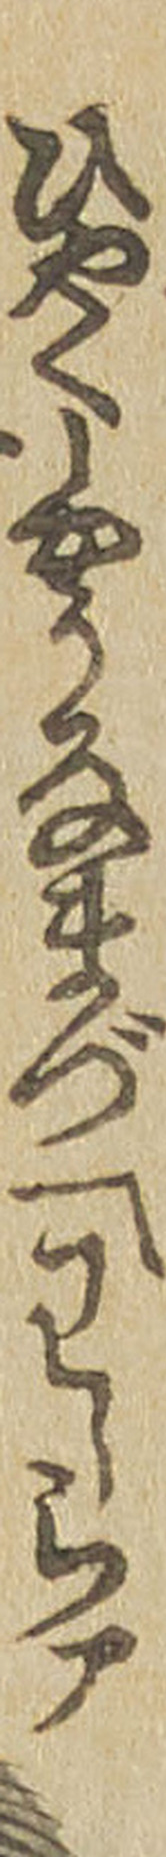ひやくしやうなまづ｢わしらァ
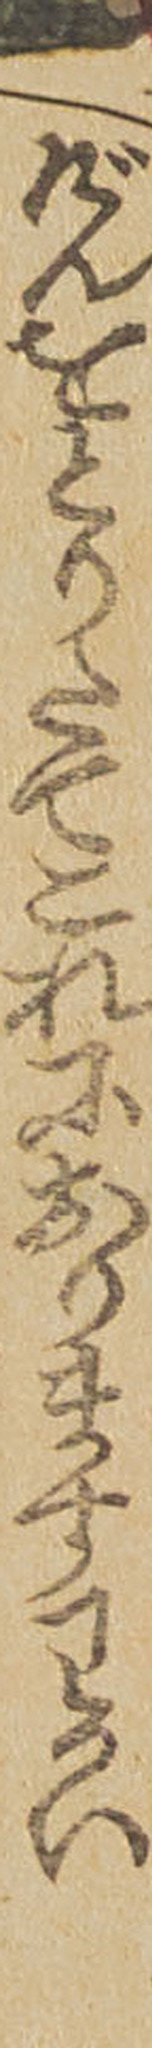げんをとりたてこれにおりますわかい
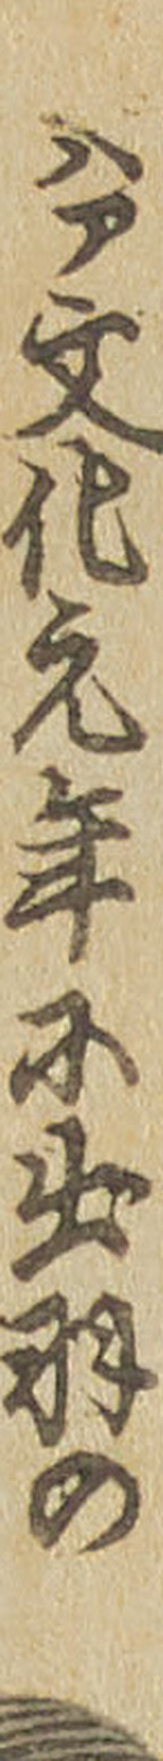ハァ文化元年に出羽の
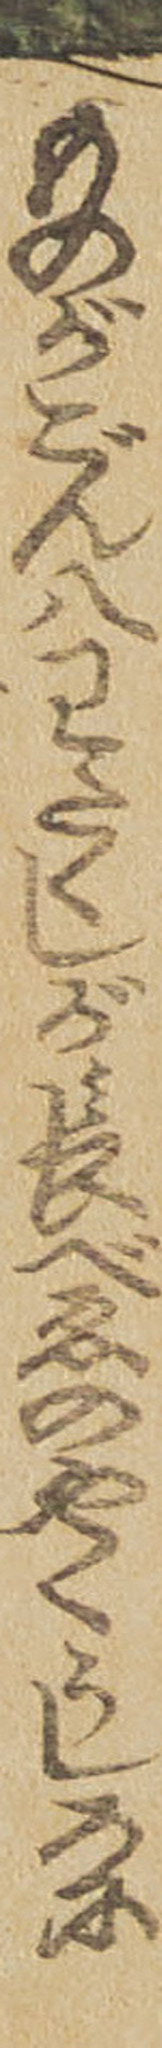ものがごん八わたくしが長べゑのやくうしろに
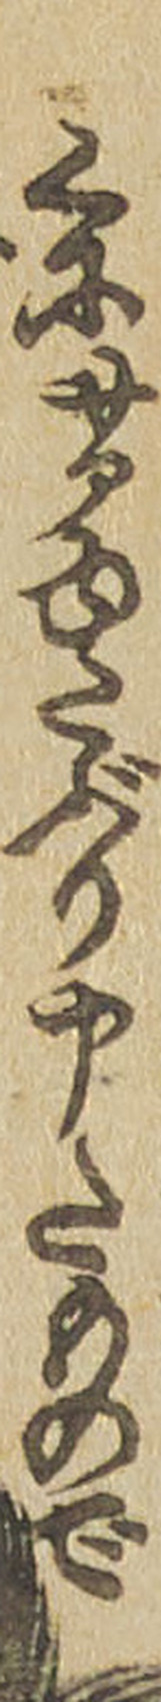くにサアゆたぶり申たもので
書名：地震太平記
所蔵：東京大学総合図書館 General Library in the University of Tokyo, JAPAN
